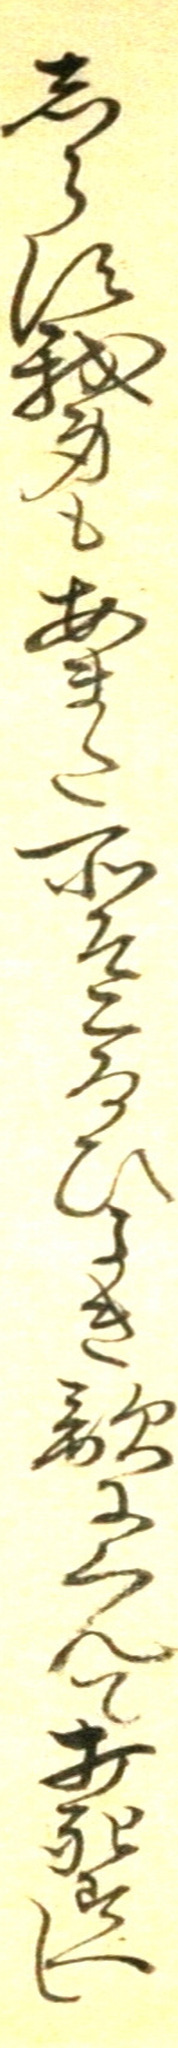しらす我身もあまた所そこなひよき敵にくんて打死すへし
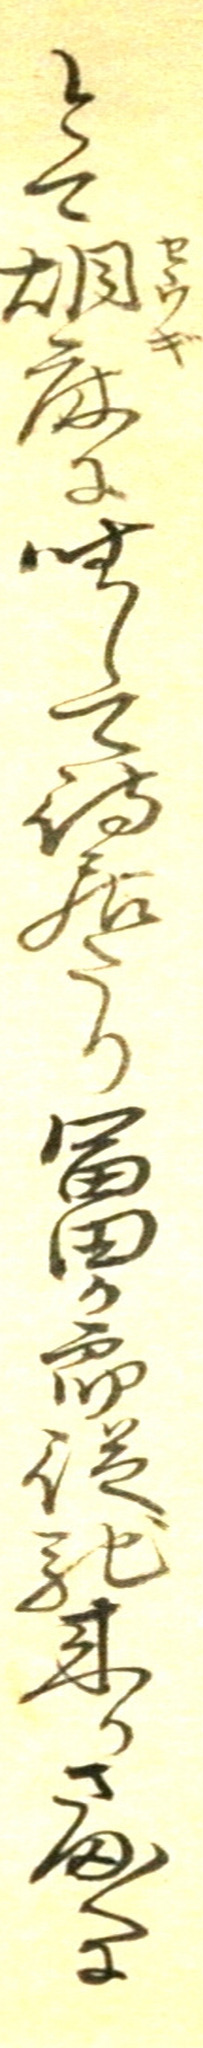とて胡床に坐して待居たり富田か郎従来りさま〳〵に
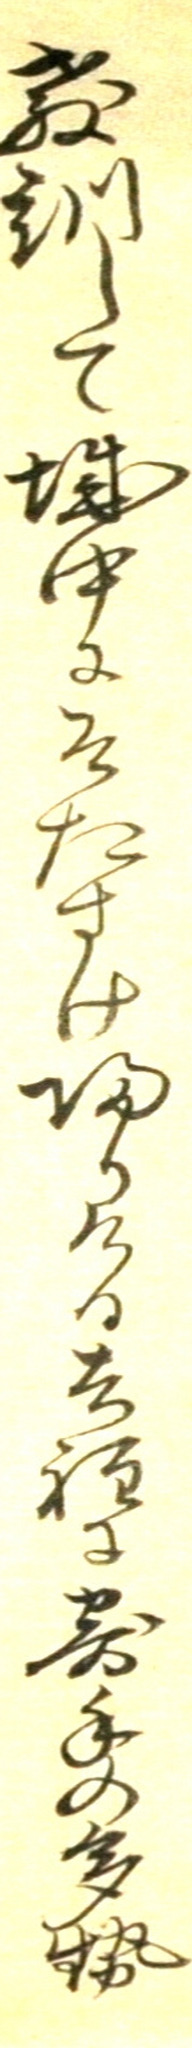教訓して城中にそたすけ帰りける去程に寄手の多勢
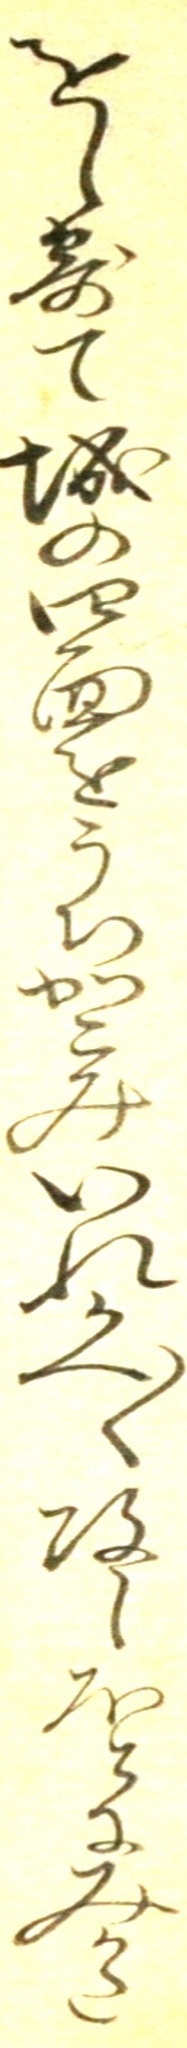をし寄て城の四面をうちかこみいれかへ〳〵攻しほとにみかた
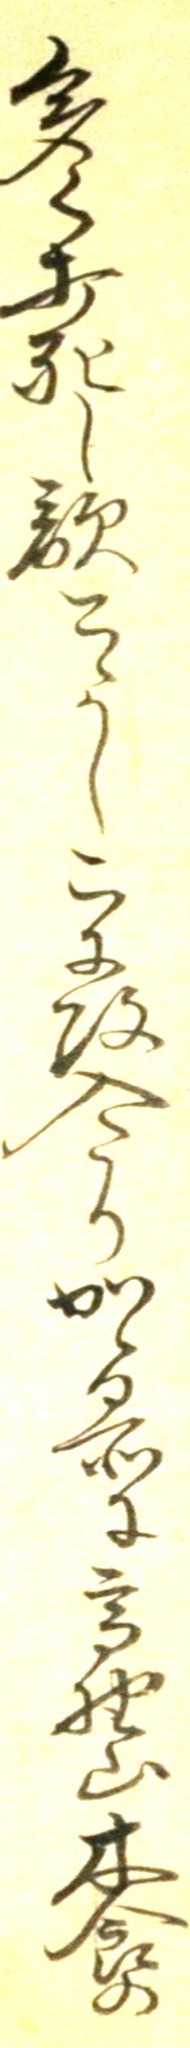多く打死し敵こゝかしこに攻入たりかゝる所に高野山木食の
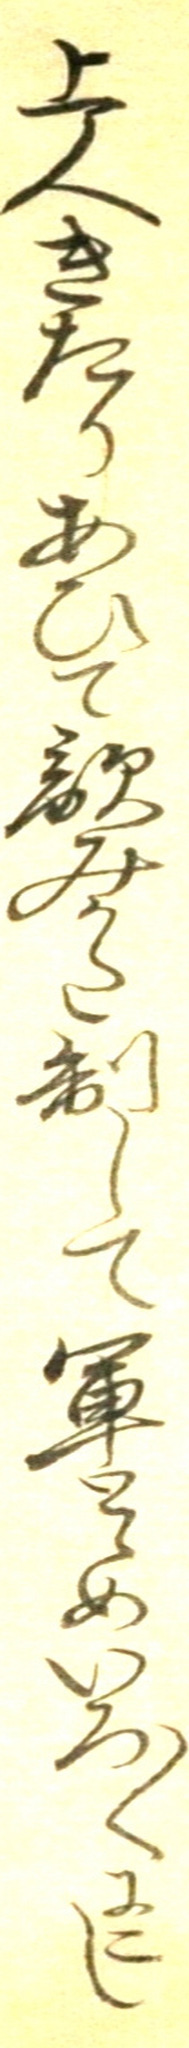上人きたりあひて敵みかた制して軍とゝめいろ〳〵にこし
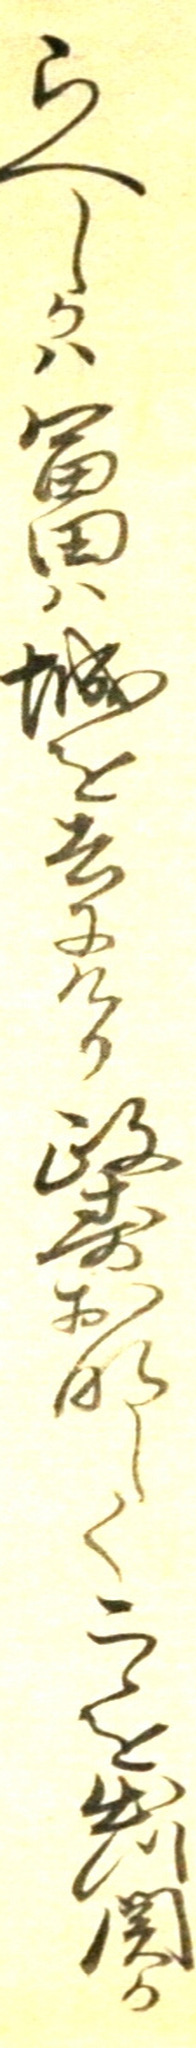らへしかは富田は城を去にけり政寿おなしくこゝを出つ関か
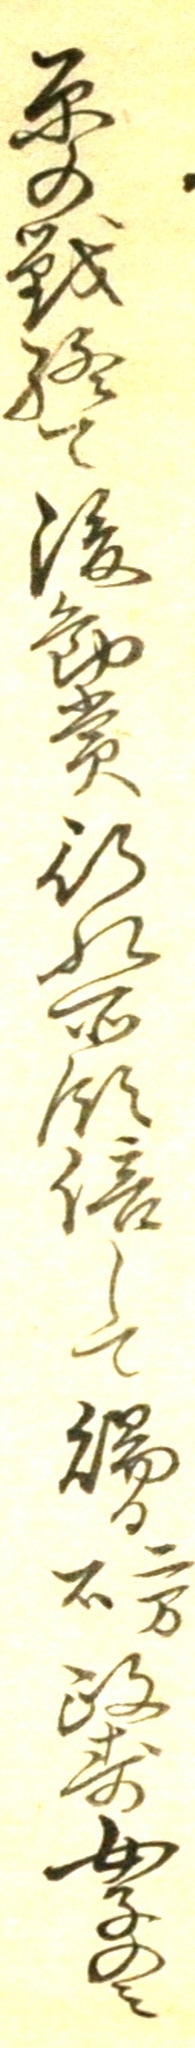原の戦終て後勧賞行れ所領倍して賜る二万石政寿女子のみ
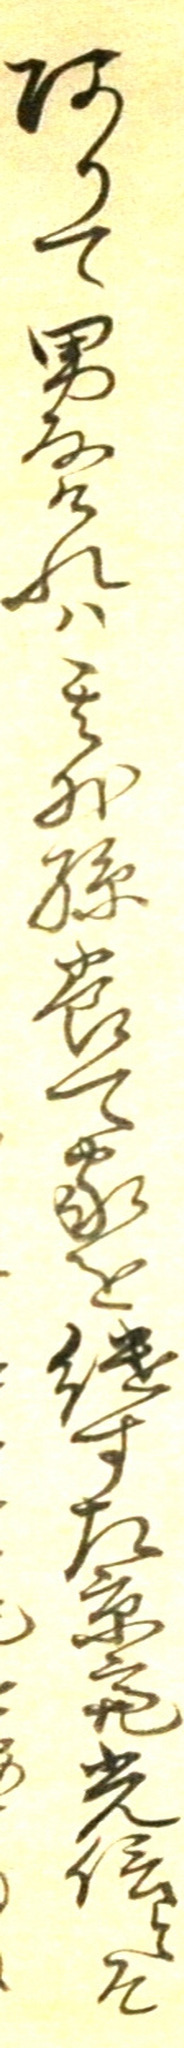ありて男なけれは其外孫養て家を継す左京亮光信とそ
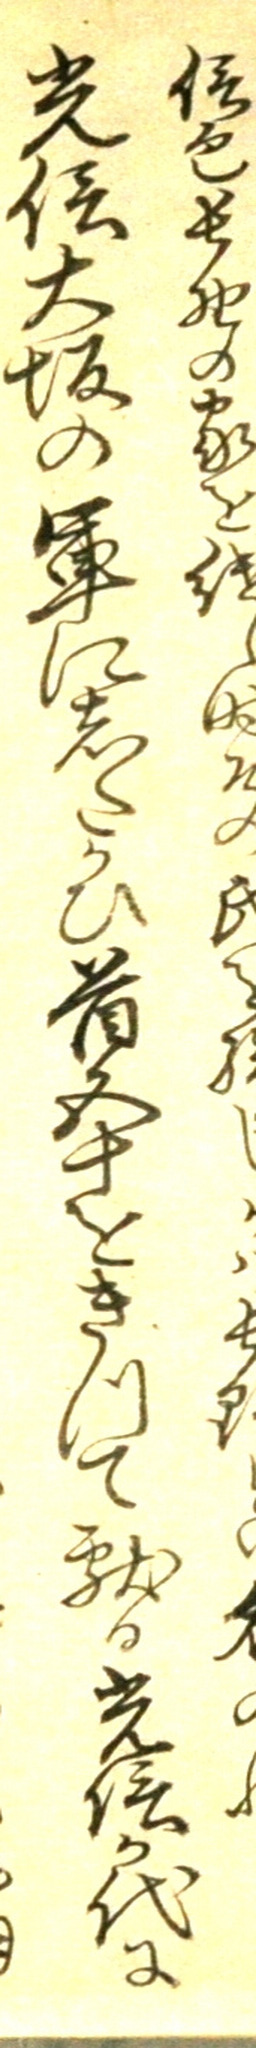光信大坂の軍にしたかひ首五十をきつて献る光信か代に

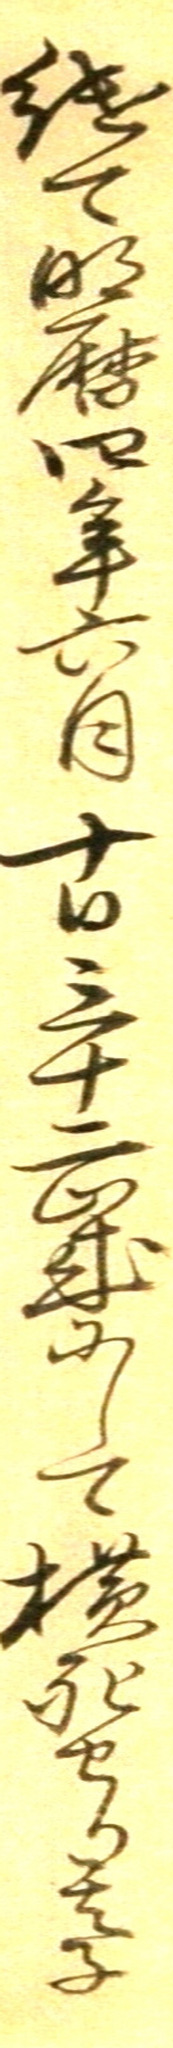継て明暦四年六月十日三十二歳にして横死せり其子
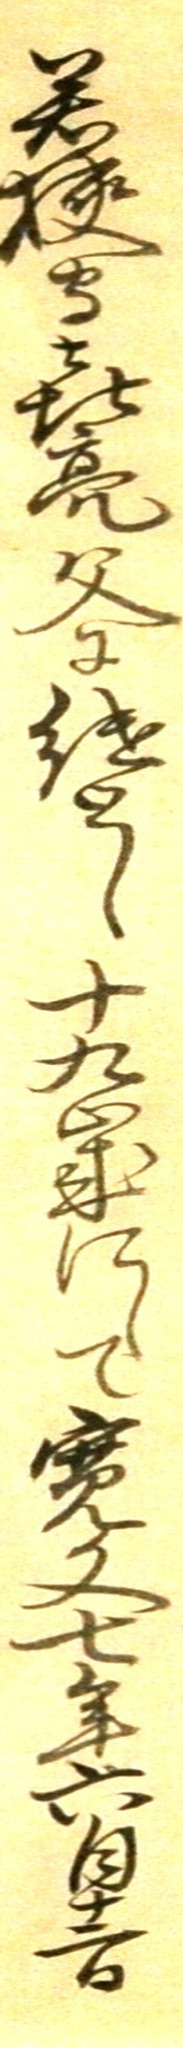若狭守喜亮父に継とし十九歳にして寛文七年六月十二日
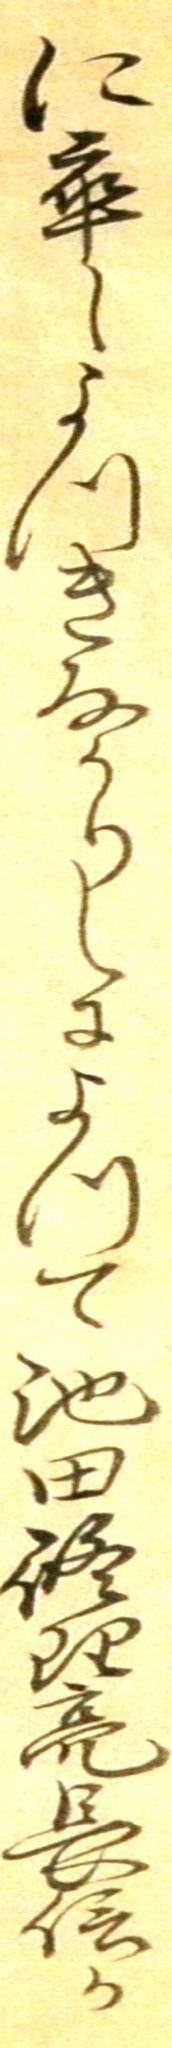に卒しよつきなかりしによつて池田修理亮長信か
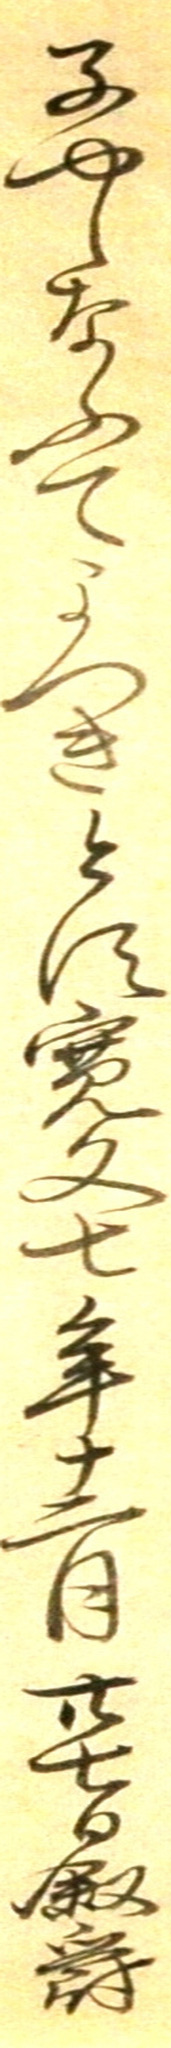子やしなふてよつきとす寛文七年十二月廿七日叙爵
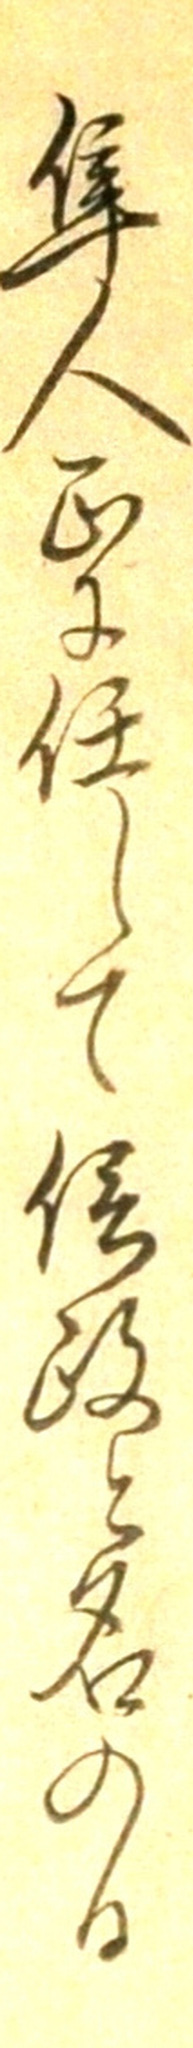隼人正に任して信政と名のる
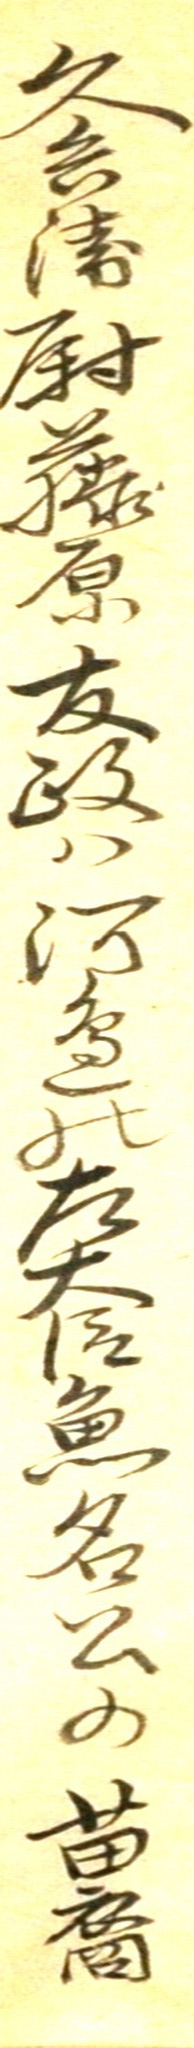久兵衛尉藤原友政は川辺の左大臣魚名公の苗裔
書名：藩翰譜（九・上）
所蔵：伊那市立高遠町図書館・合同会社AMANE
